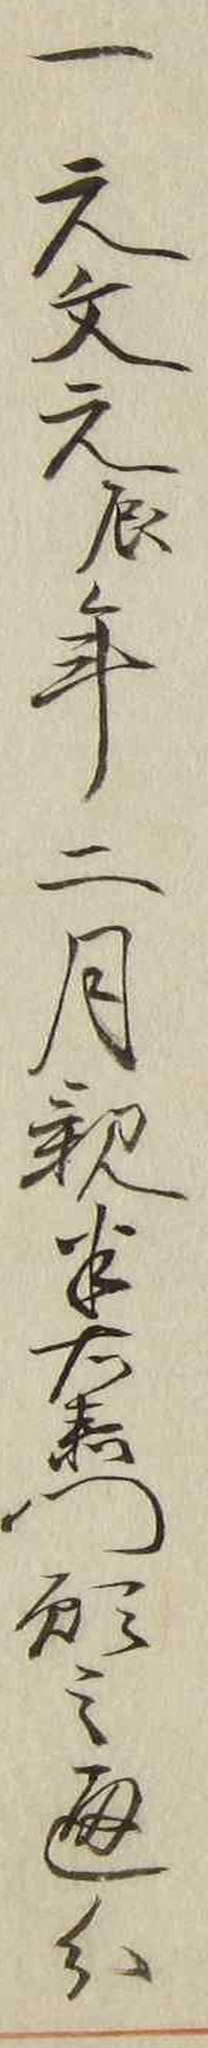一元文元辰年二月親半右衛門願之通分

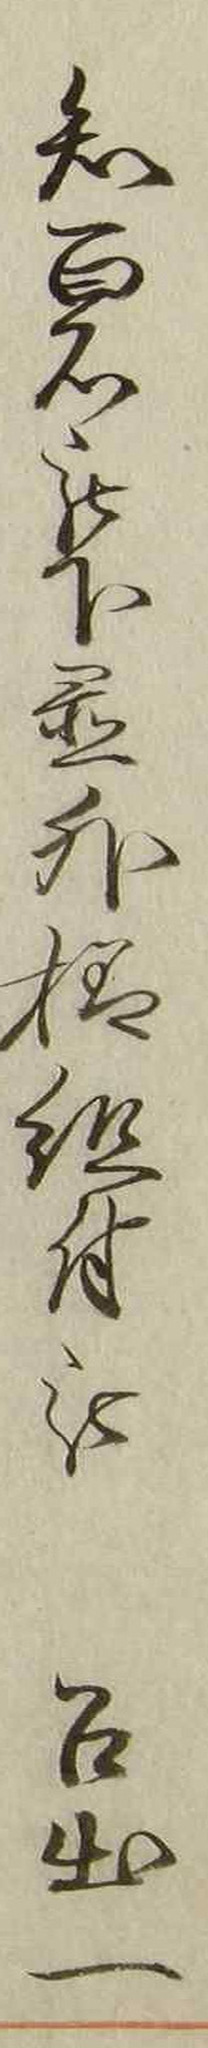知百石被下置外様組付被召出一
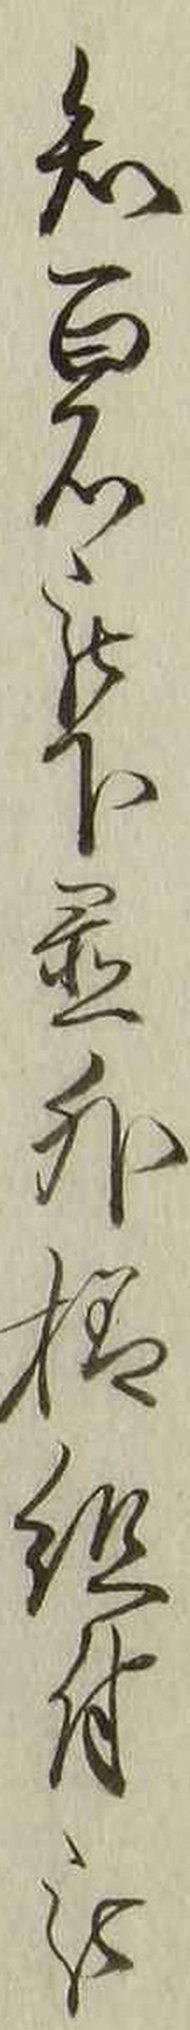知百石被下置外様組付被召出一
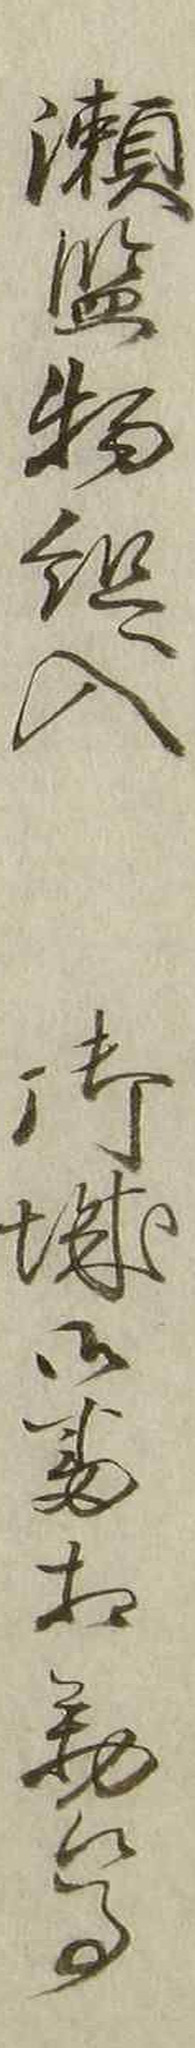瀬監物組へ入御城御番相勤候事
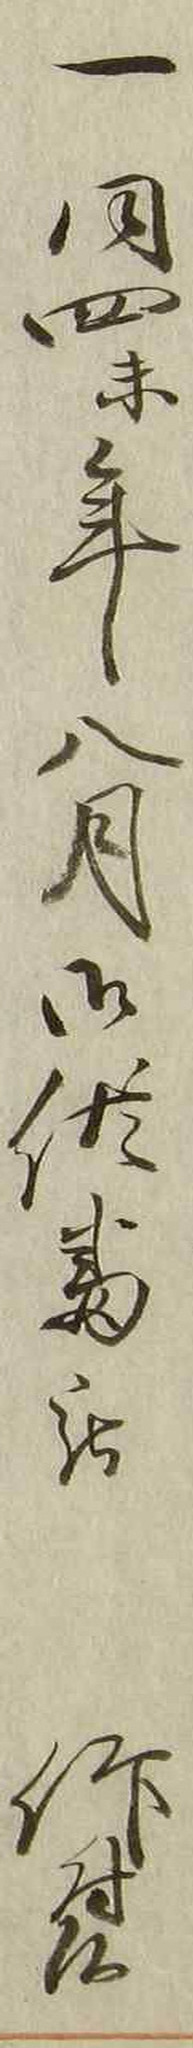一同四未年八月御供番被仰付候
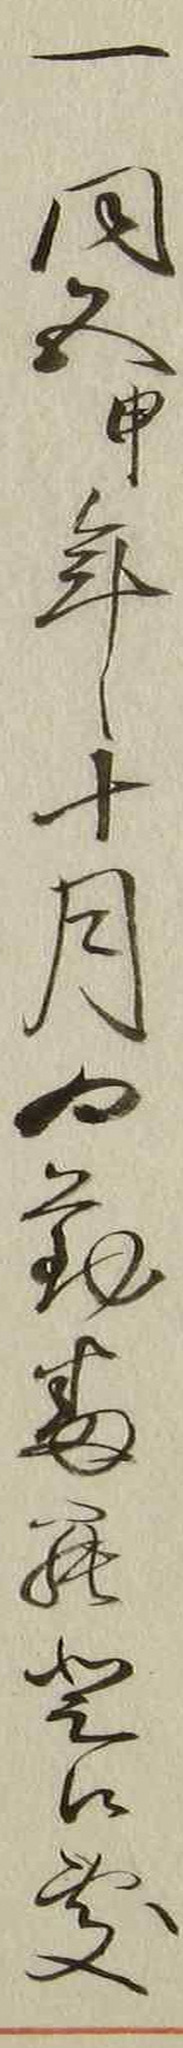一同五申年十月為勤番罷登候処
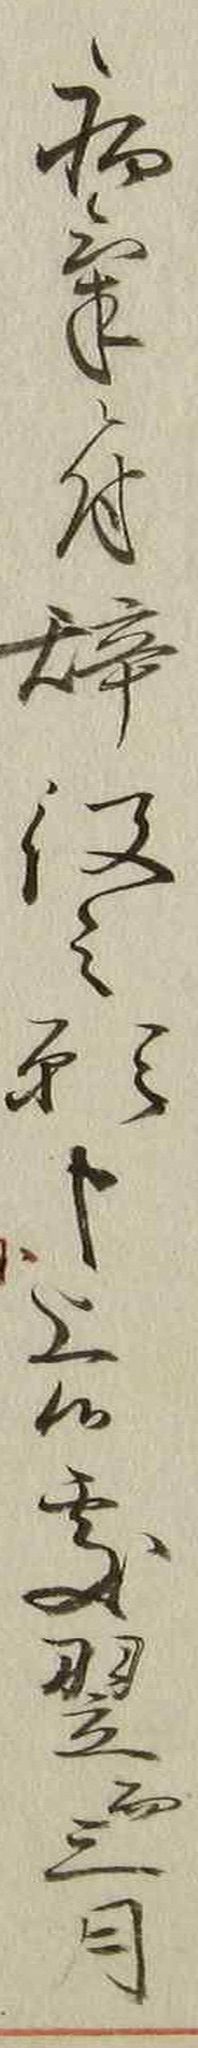病気ニ付辞役之願申上候処翌酉三月
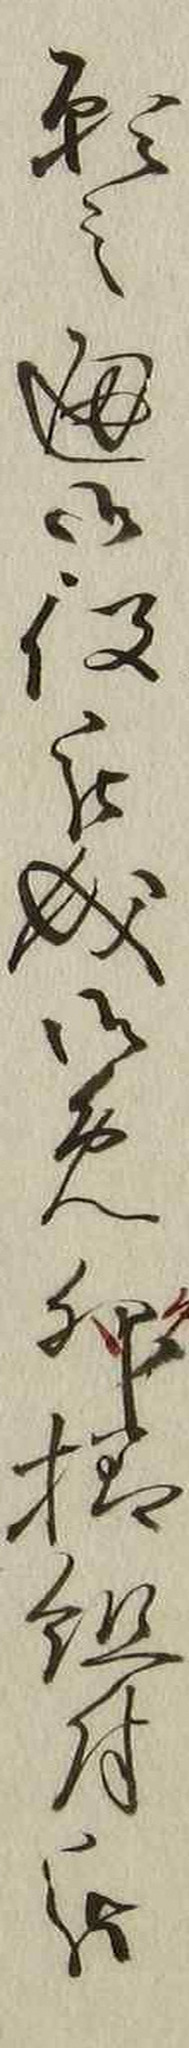願之通御役被成御免外様組付被
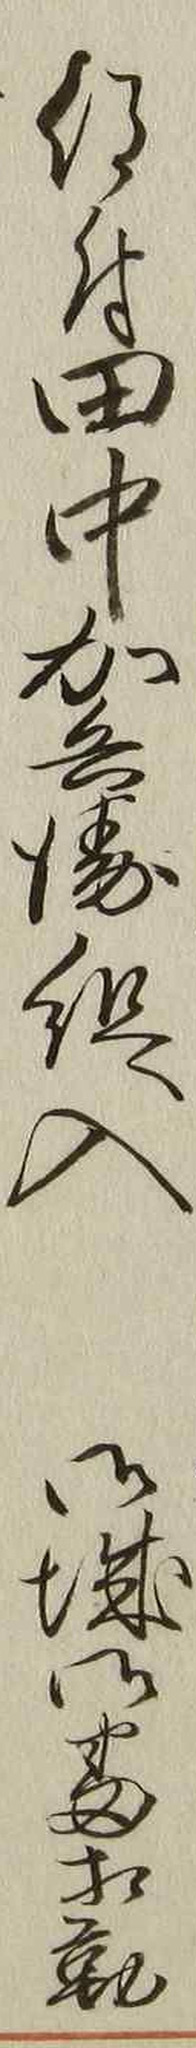仰付田中加兵衛組へ入御城御番相勤
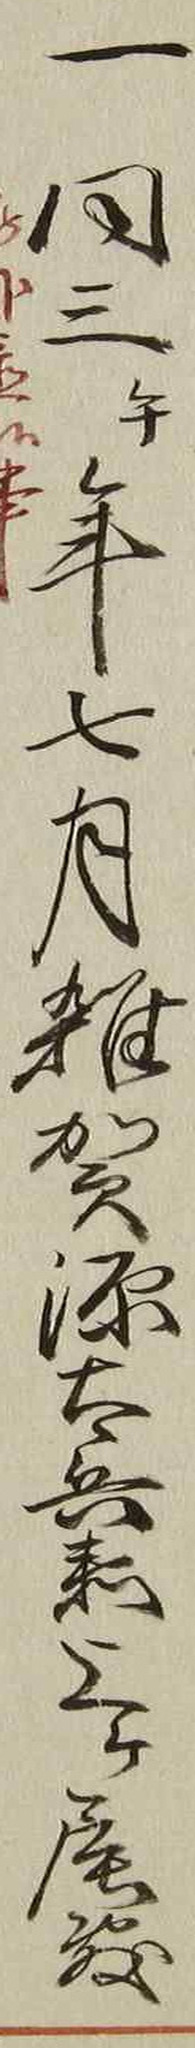一同三午年七月雑賀源太兵衛上ヶ屋敷
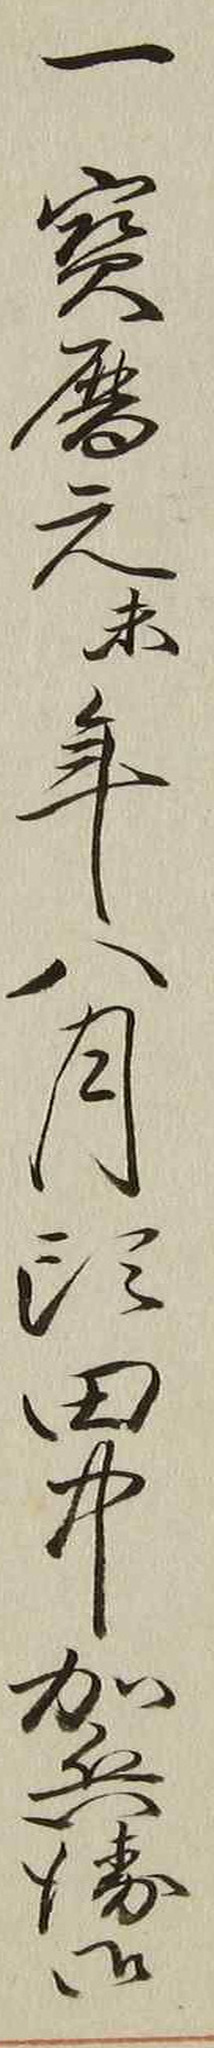一宝暦元未年八月頭田中加兵衛御
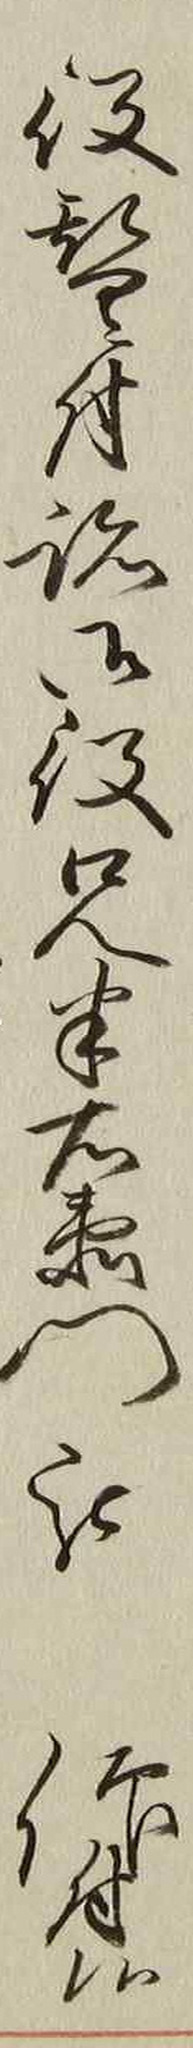役替えニ付跡御役兄半右衛門被仰付候
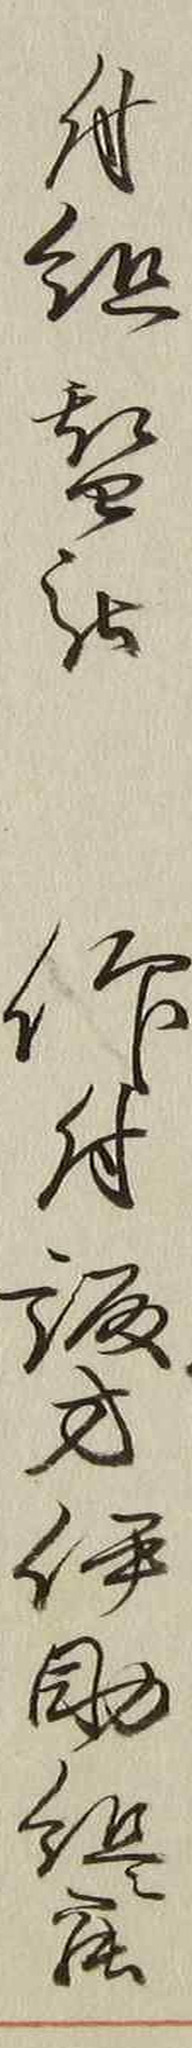付組替被仰付諏方伊助組ニ罷
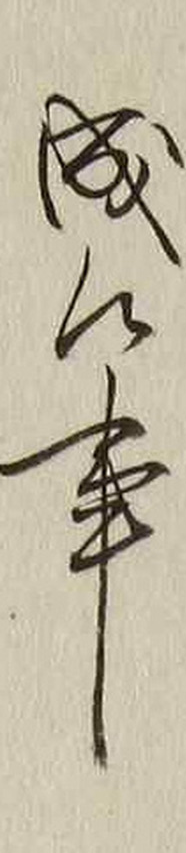成候事
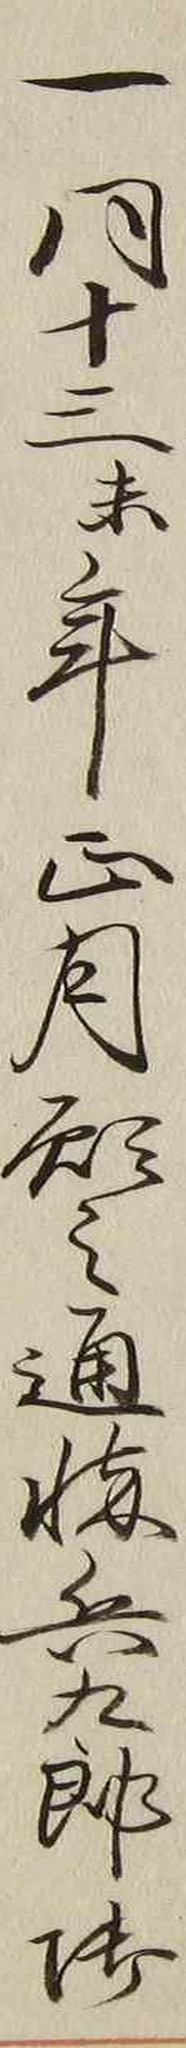一同十三未年正月願之通忰兵九郎御
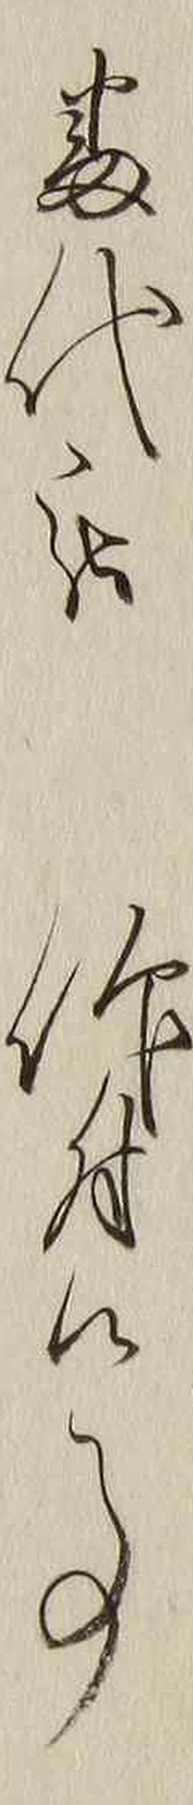番代被仰付候事
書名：諸士系譜　巻之54　ほ之部1
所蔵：会津若松市立会津図書館
